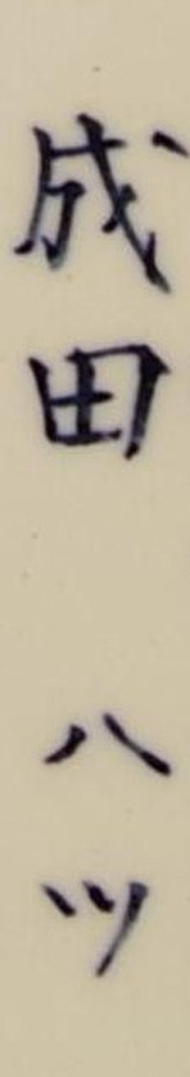成田ハツ
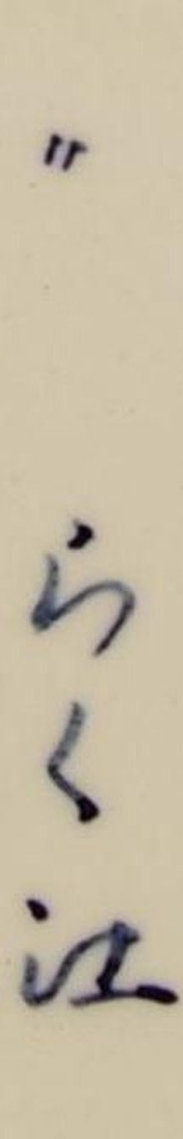らく江
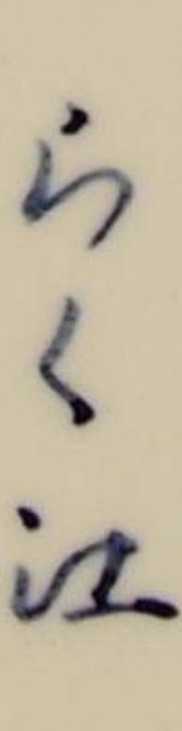らく江
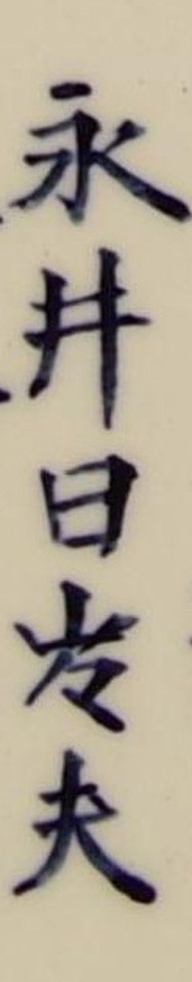永井日出夫
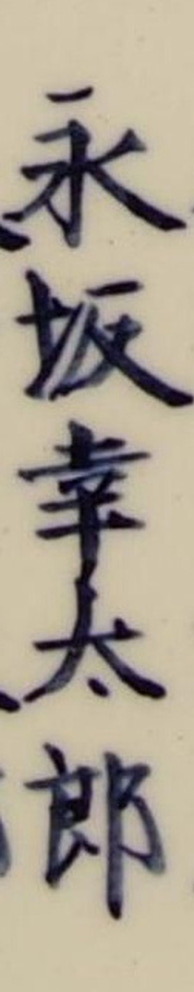永坂幸太郎
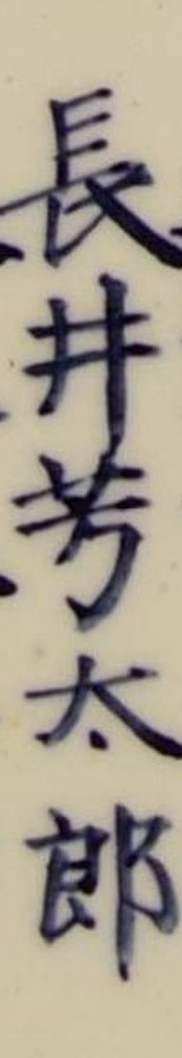長井芳太郎
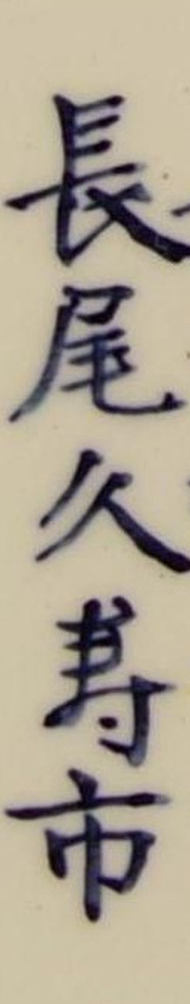長尾久寿市
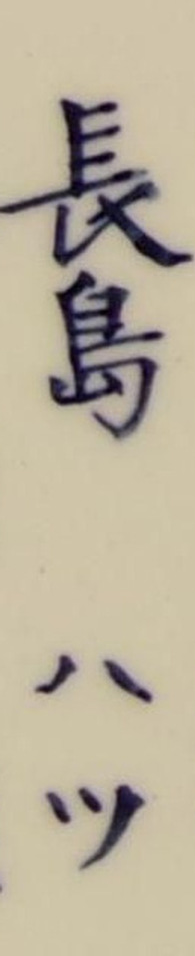長島ハツ
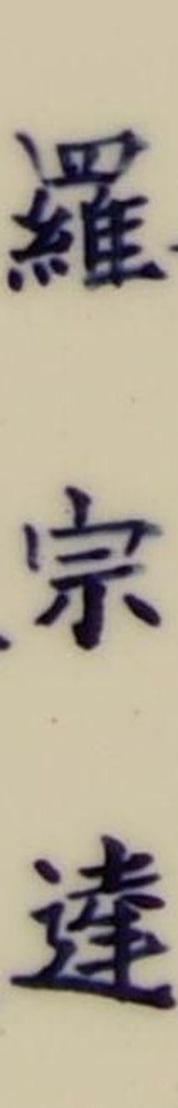羅宗達
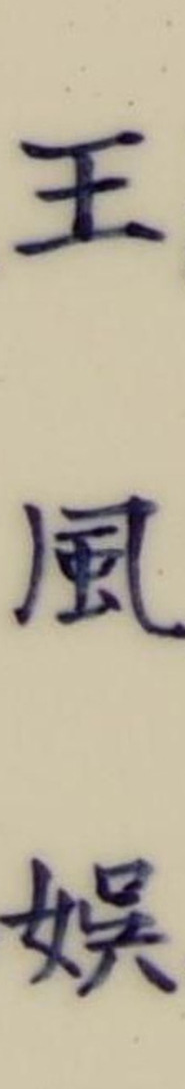王風娯
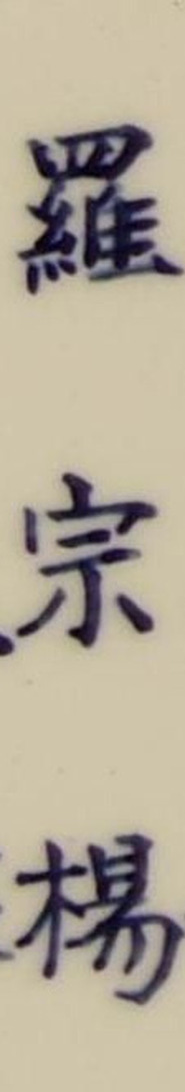羅宗達

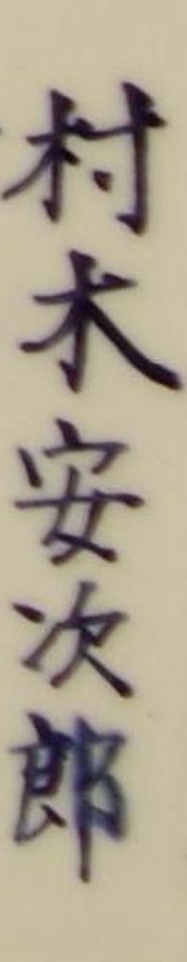材木安次郎
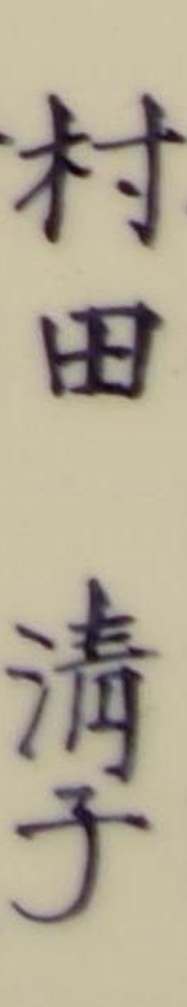村田清子
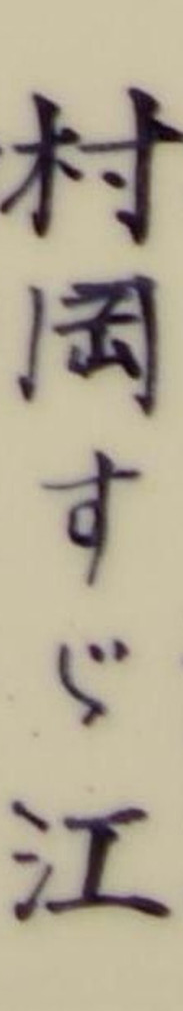村岡すず江
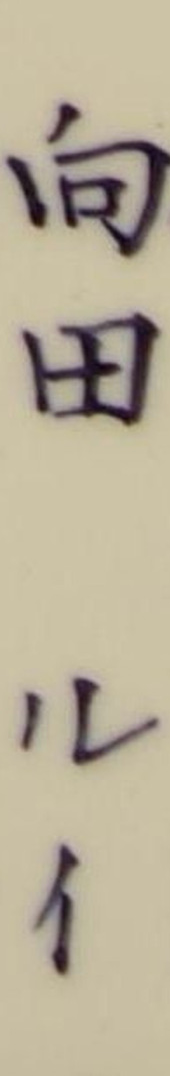向田ルイ
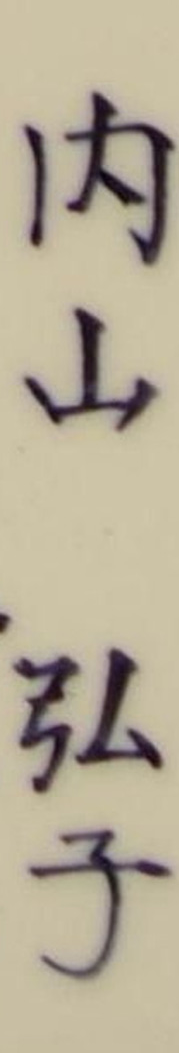内山弘子
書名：E~L
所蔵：高野山金剛峯寺
